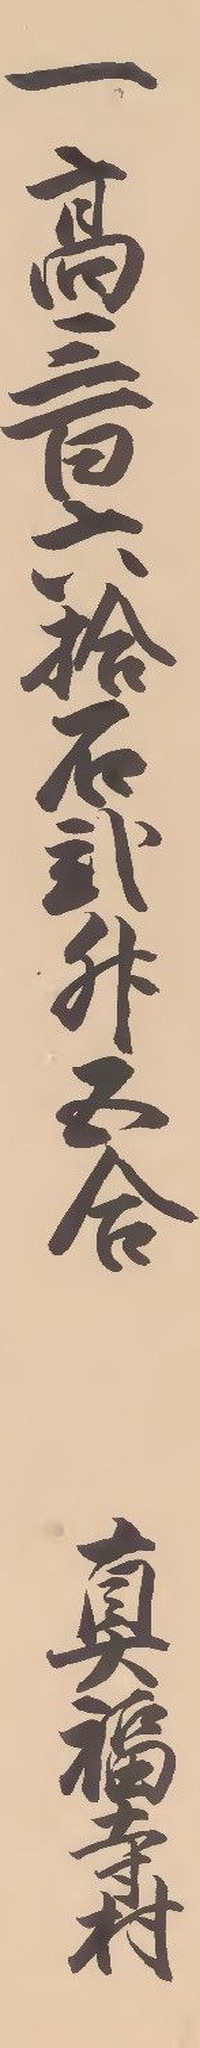一高三百六拾石弐升五合真福寺村
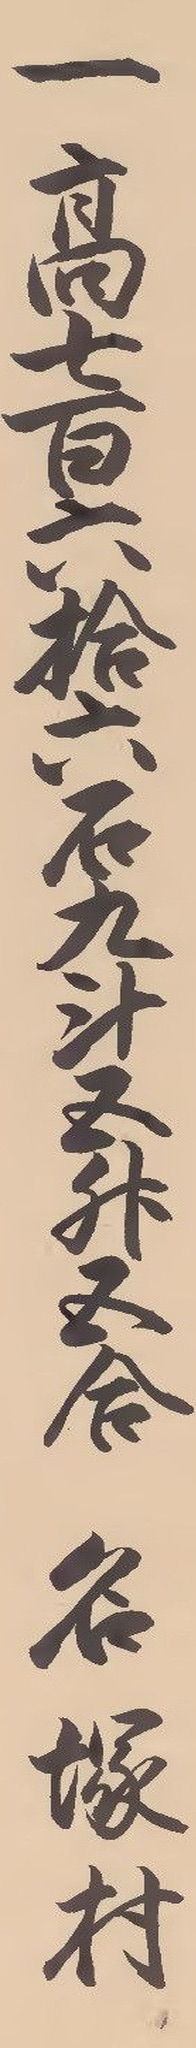一高七百六拾六石九斗五升五合名塚村
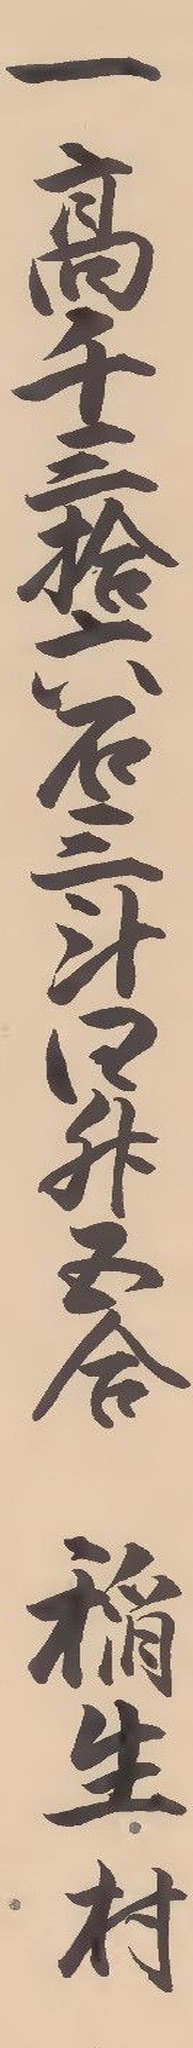一高千三拾六石三斗四升五合稲生村
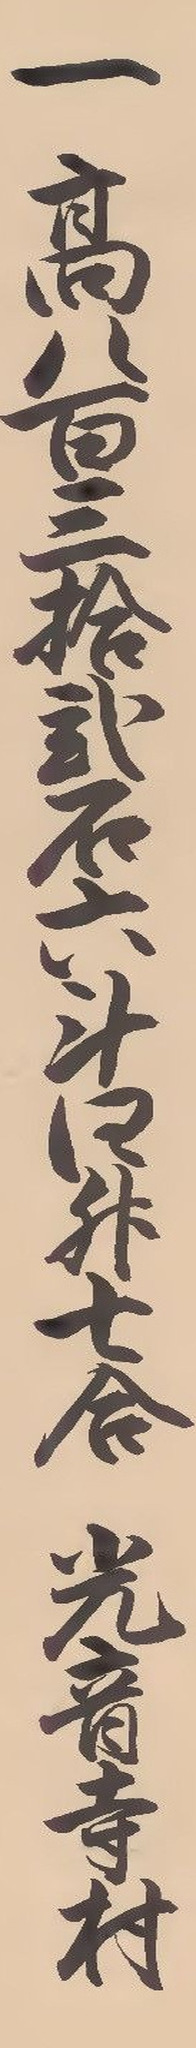一高八百三拾弐石六斗四升七合光音寺村
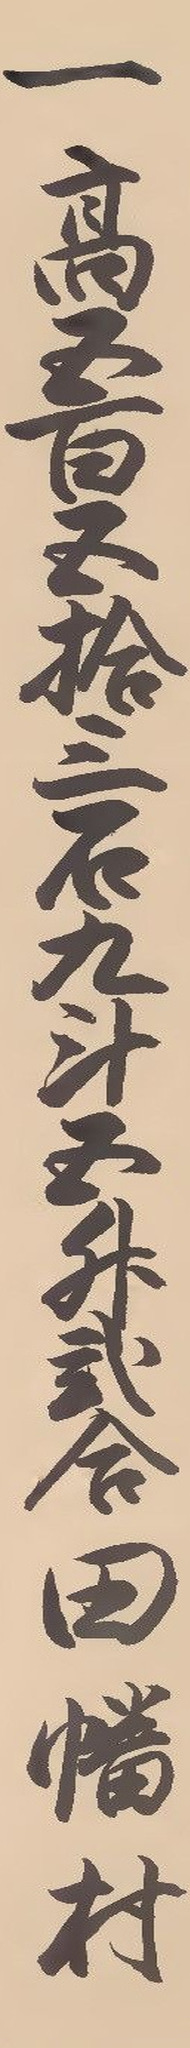一高五百五拾三石九斗五升弐合田幡村
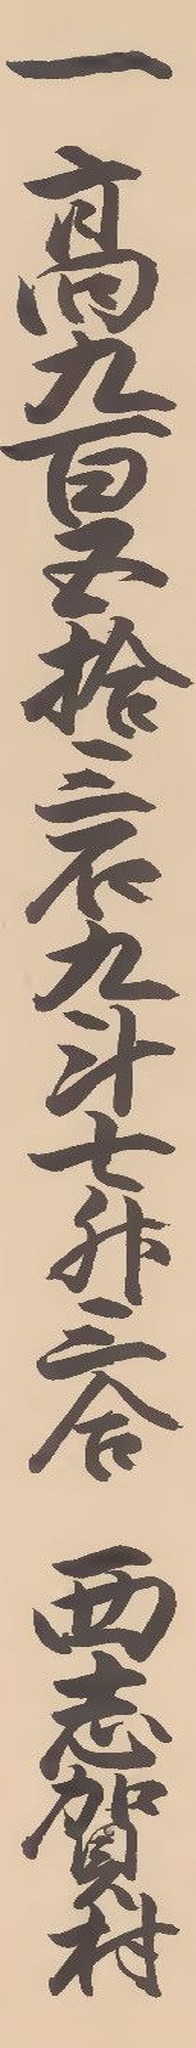一高九百五拾三石九斗七升三合西志賀村
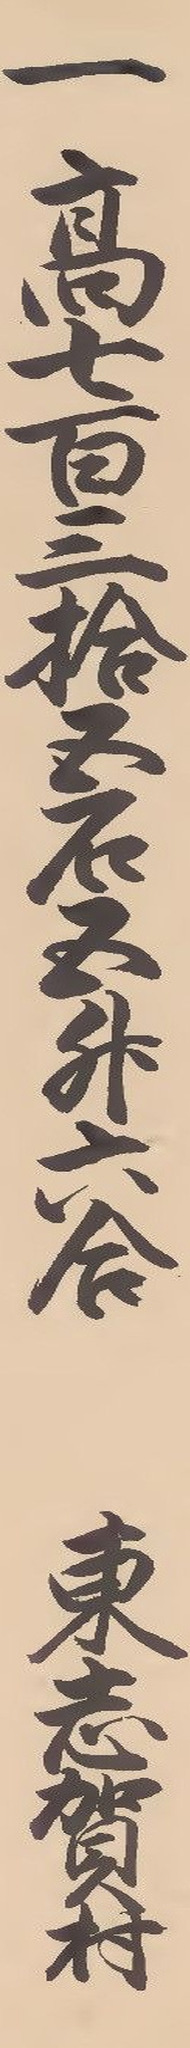一高七百三拾五石五升六合東志賀村
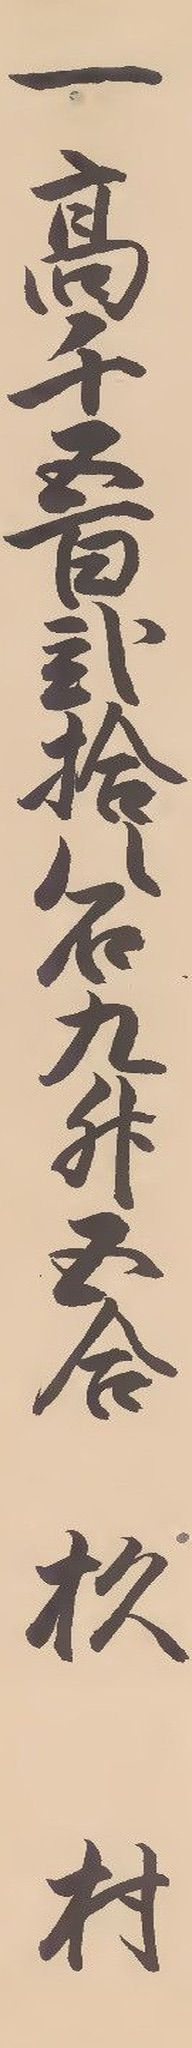一高千五百弐拾八石九升五合杉村

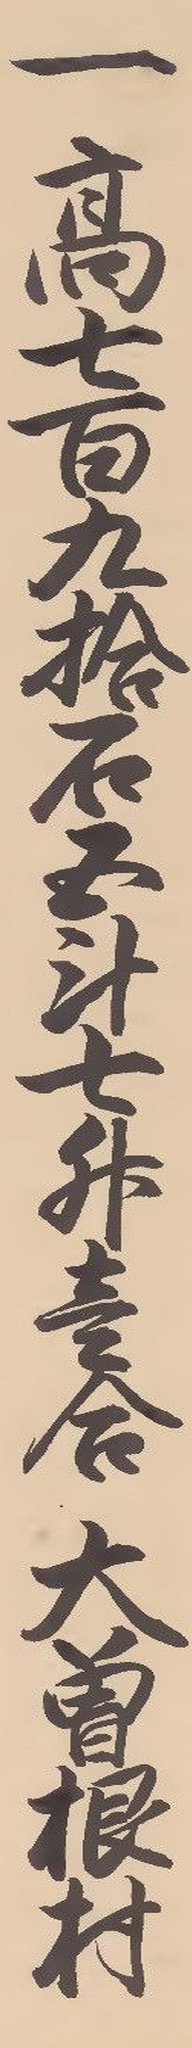一高七百九拾石五斗七升壱合大曽根村
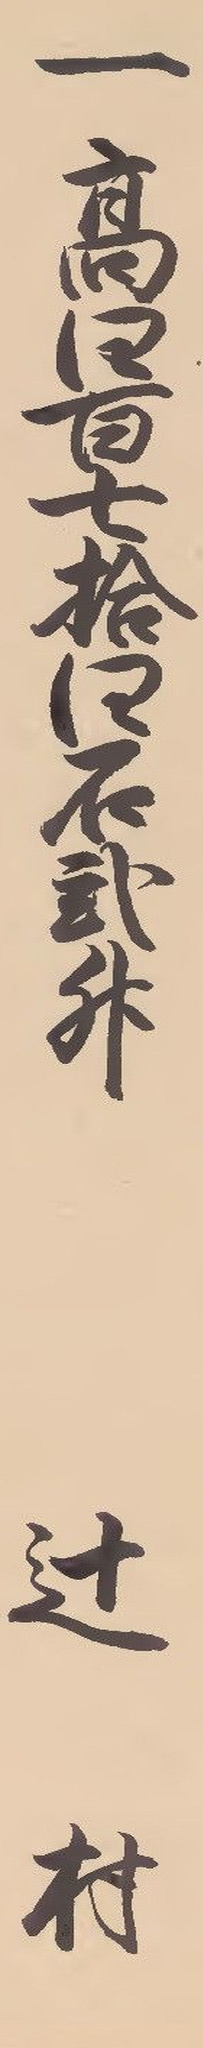一高四百七拾四石弐升辻村
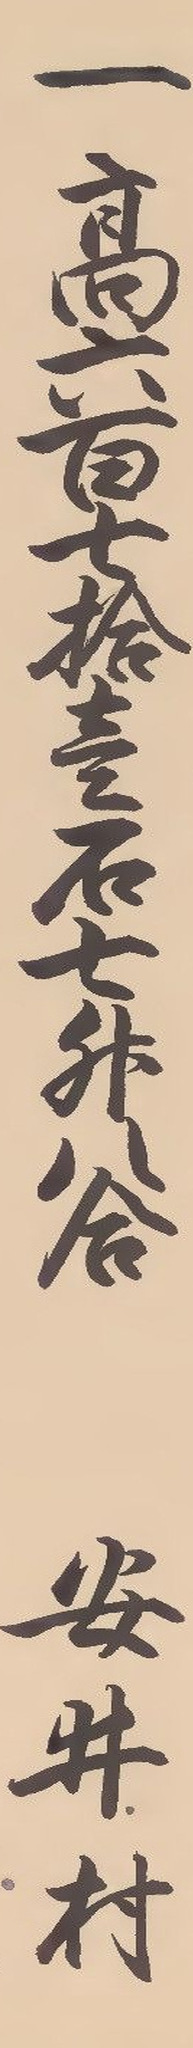一高六百七拾壱石七升八合安井村
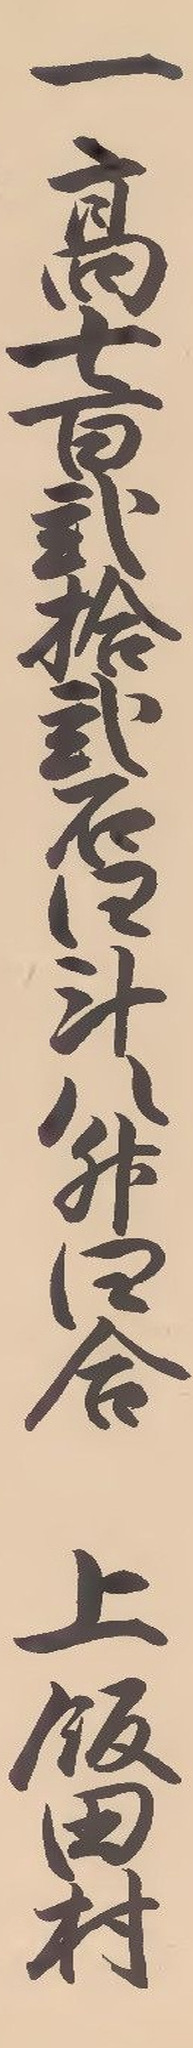一高七百弐拾弐石四斗八升四合上飯田村
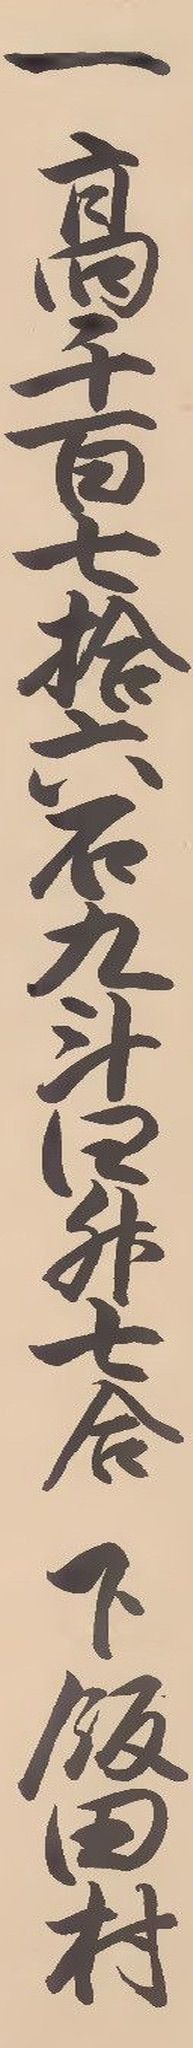一高千百七拾六石九斗四升七合下飯田村
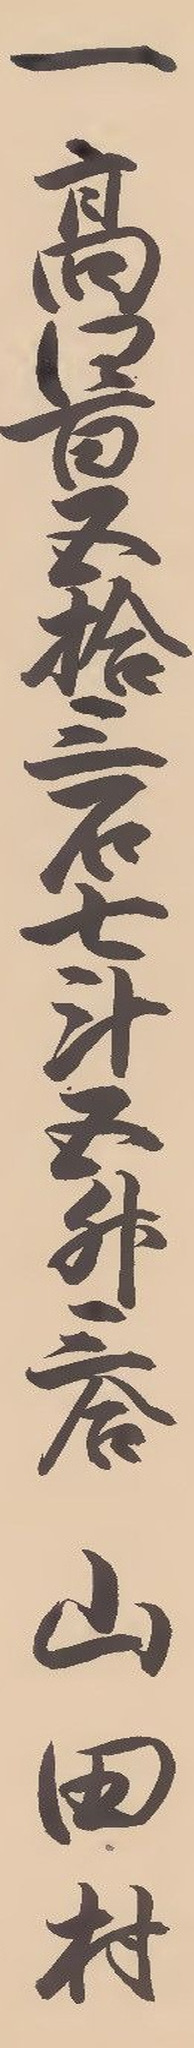一高四百五拾三石七斗五升三合山田村
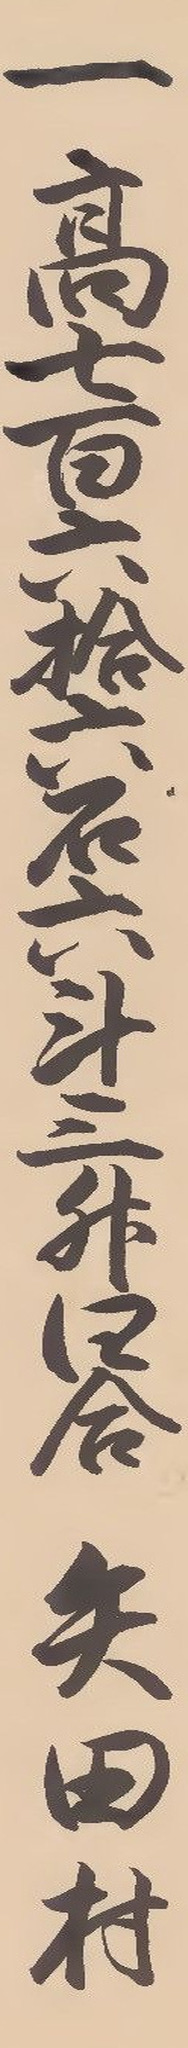一高七百六拾六石六斗三升四合矢田村
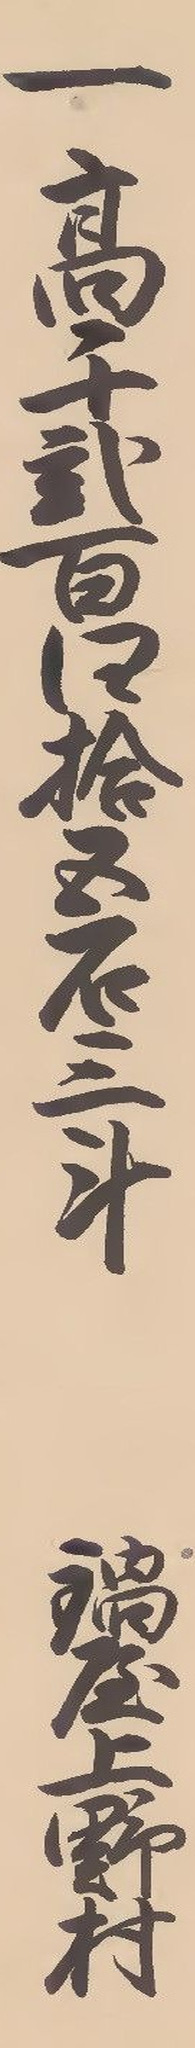一高千弐百四拾五石三斗鍋屋上野村
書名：尾張国郷帳
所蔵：国立公文書館 National Archives of Japan
